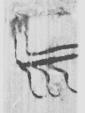巟
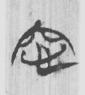{穴心}
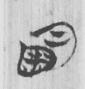{甶月}
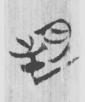朔
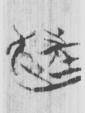{辶㞷}
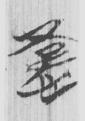{韋心}
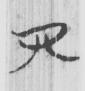四
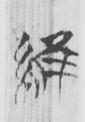維
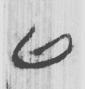㠯（以）
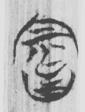{宀二水日}
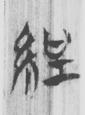{糸呈}
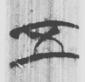五
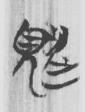{見兆}
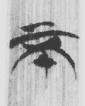不
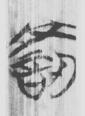罰
